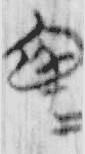躬身
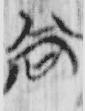尚
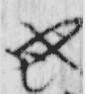母
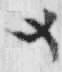又（有）
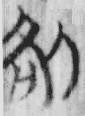咎
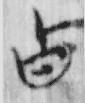占
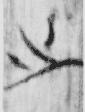之
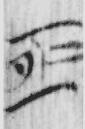亙（恆）
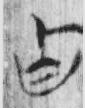占
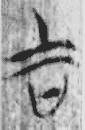吉
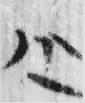少
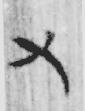又（有）
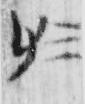於
